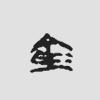倉
